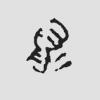{胃刀}
